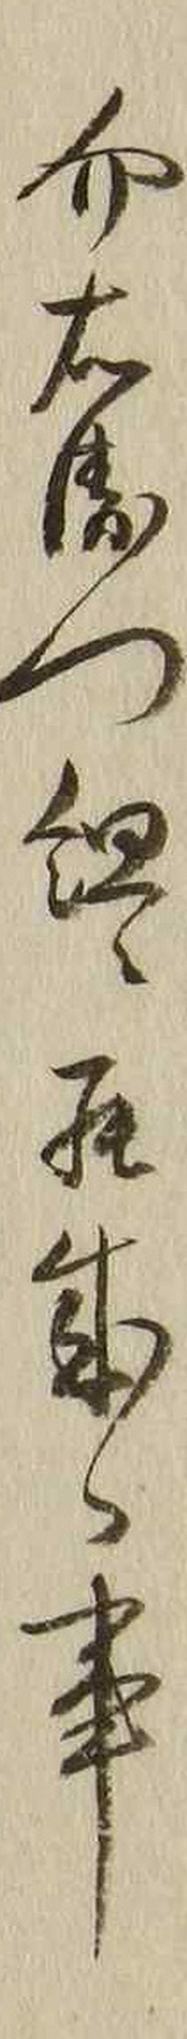介右衛門組へ罷成候事
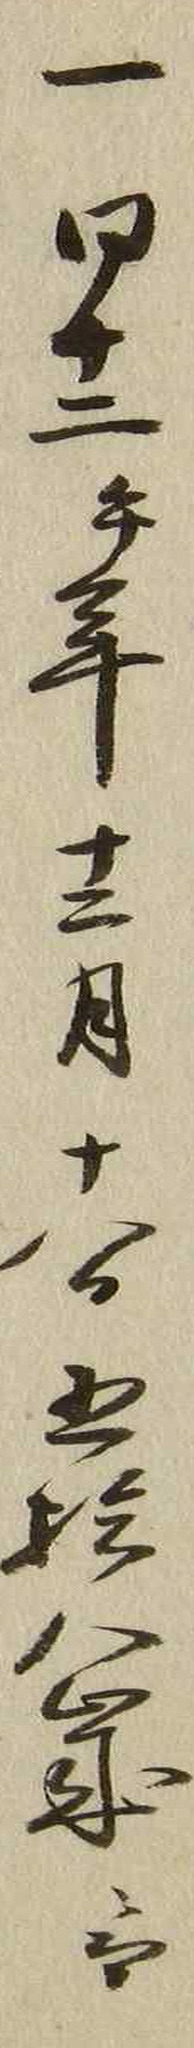一同十二午年十二月十八日五拾八歳ニ而
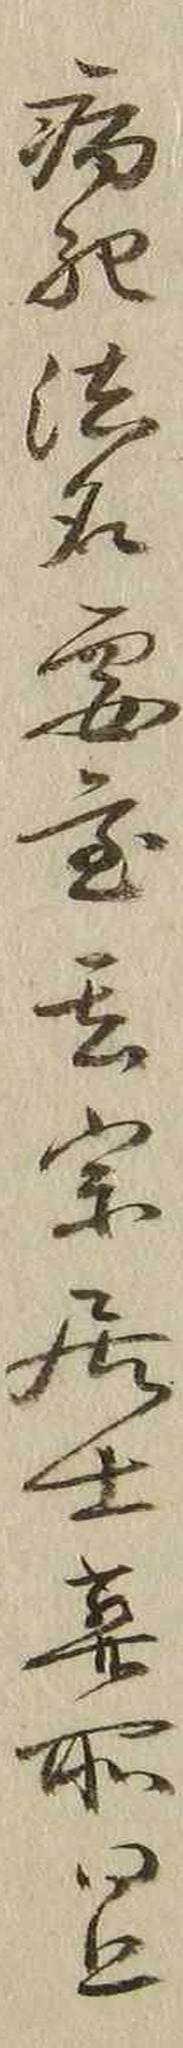病死法名要主玄宗居士葬所同上
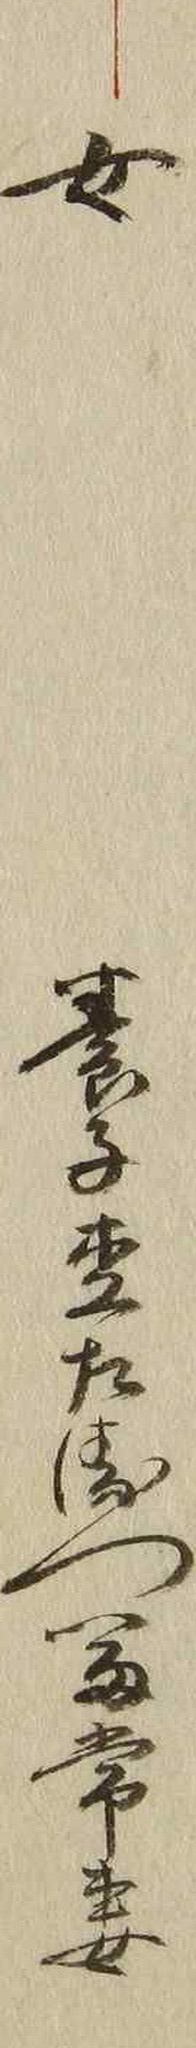女養子杢左衛門富常妻
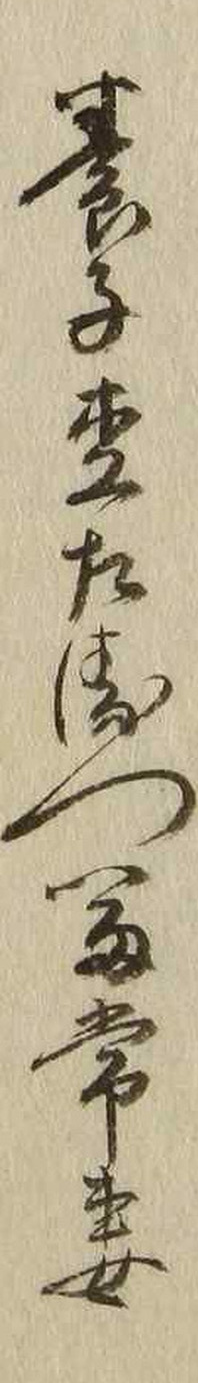女養子杢左衛門富常妻
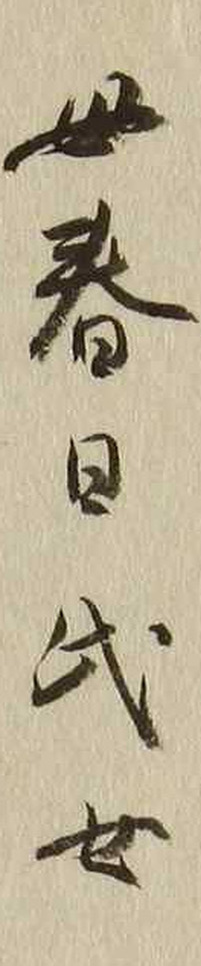母春日氏女
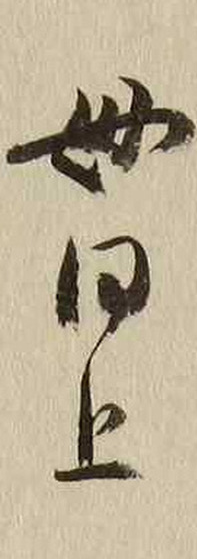母同上
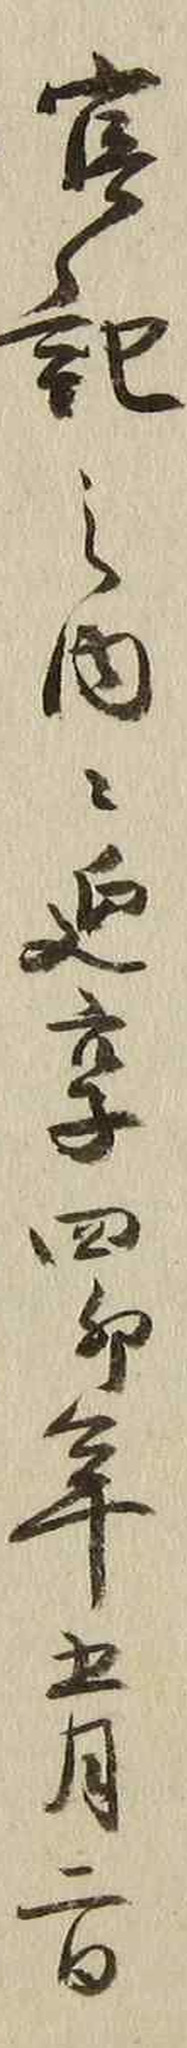官記之内ニ延享四卯年五月二日
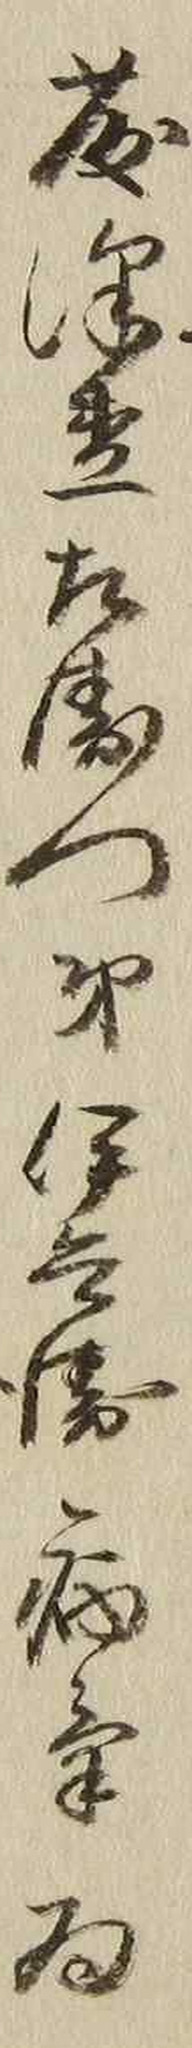藤沢杢左衛門弟伊兵衛病気為
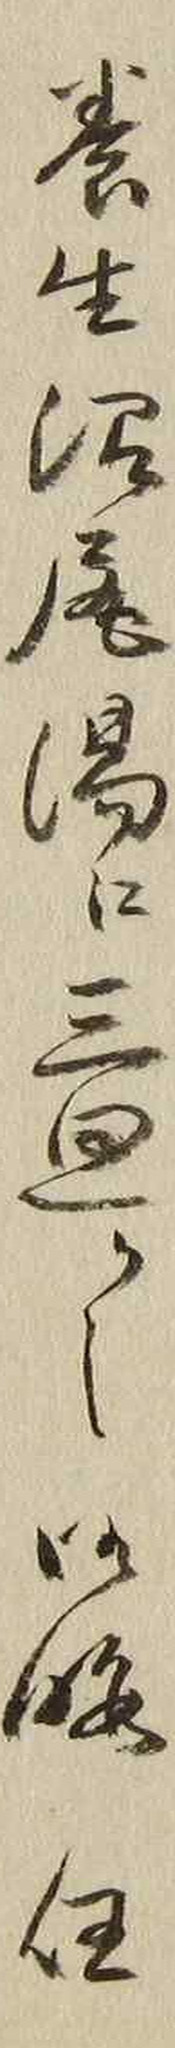養生沼尾湯江三廻り之御暇任
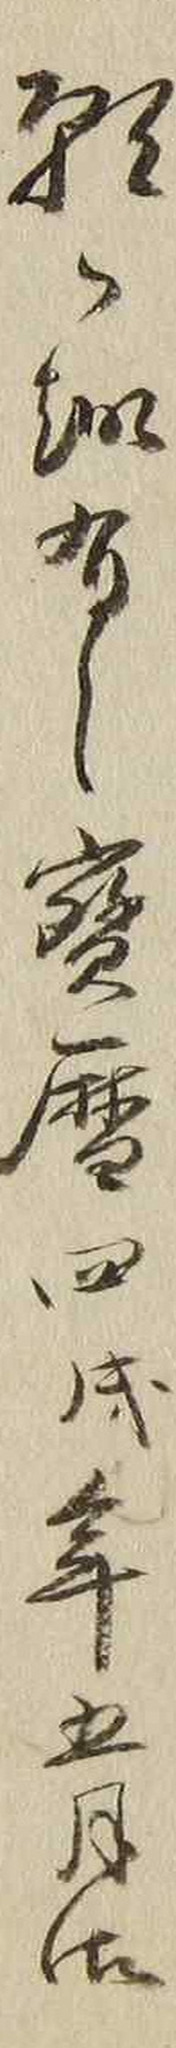願候趣有之宝暦四戌年五月御
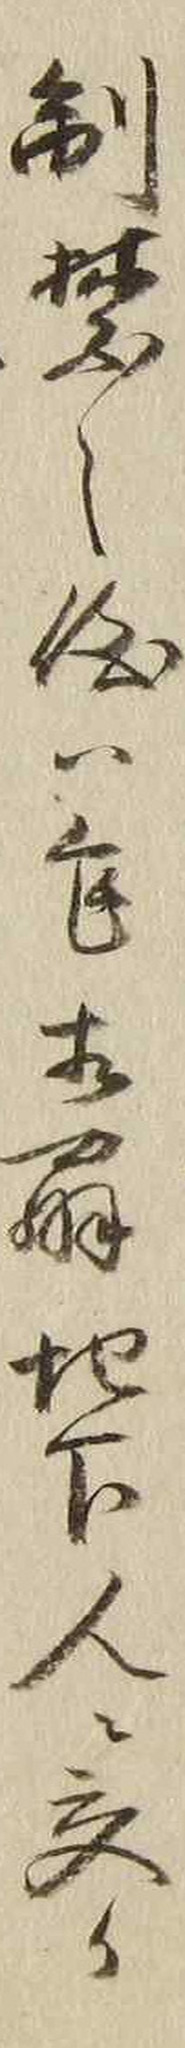制禁之儀ハ乍相弁地下人ニ交り
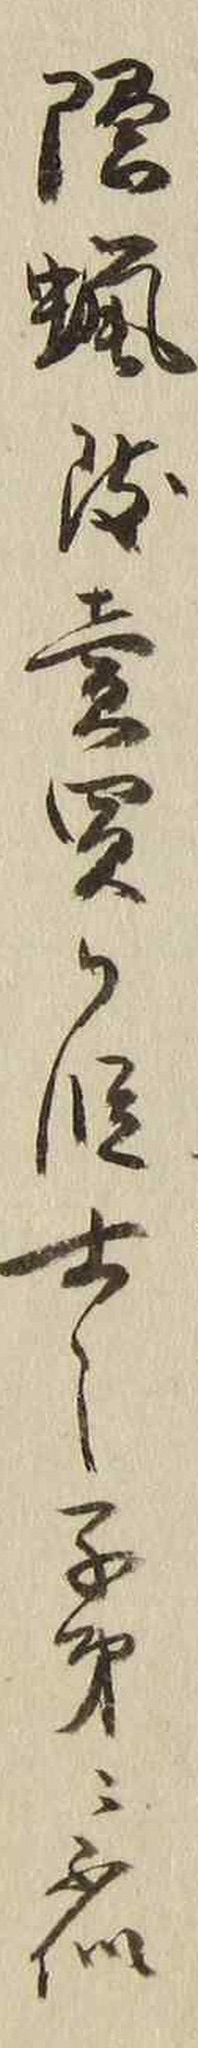隠蝋致売買候段士之子弟ニ不似
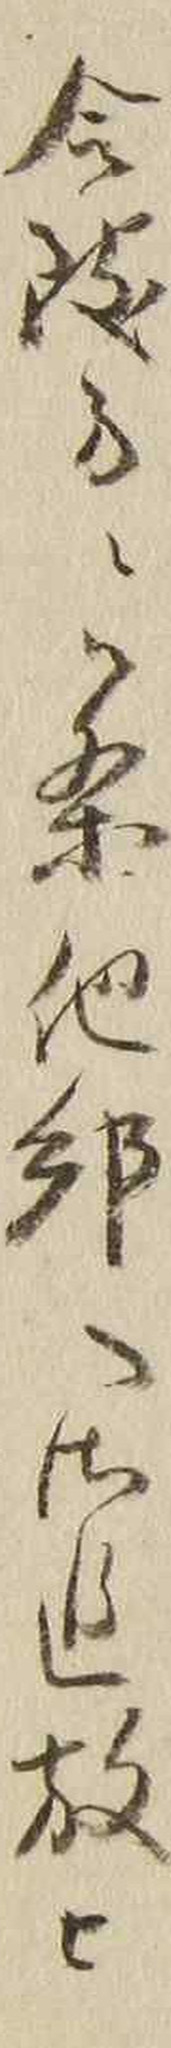合致方ニ候条他邦へ御追放被
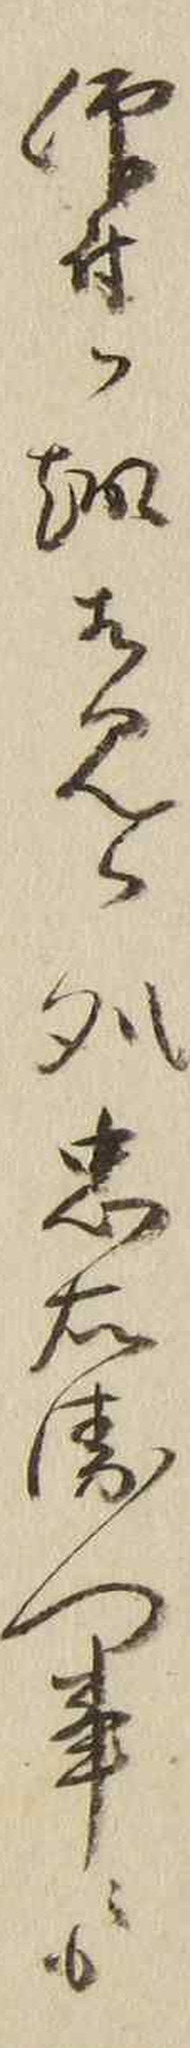仰付候趣相見候処忠右衛門事ニも

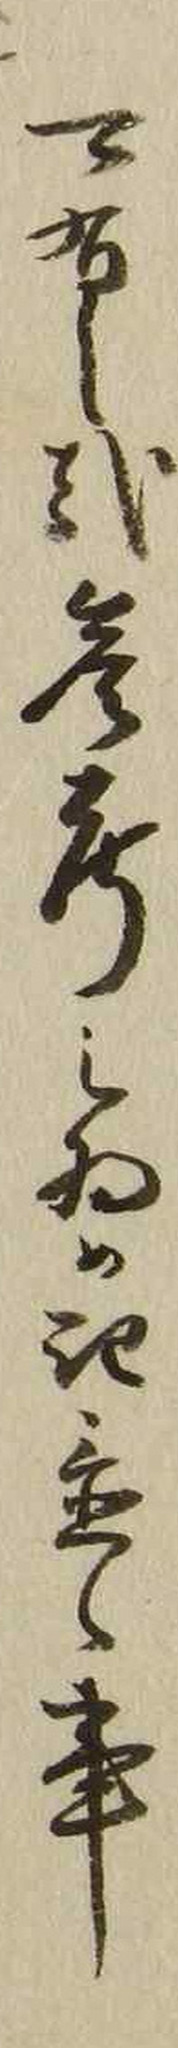可有之哉参考之為め記置候事
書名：諸士系譜　巻之236　ふ之部4
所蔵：会津若松市立会津図書館
